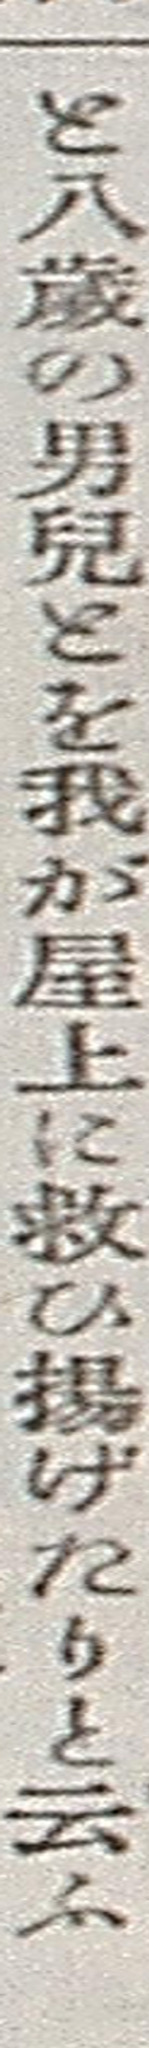と八歳の男兒とを我が屋上に救ひ揚げたりと云ふ
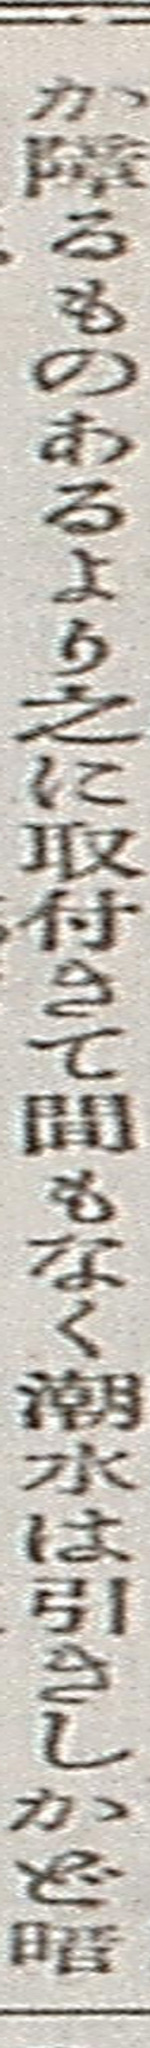か障るものあるより之に取付きて間もなく潮水は引きしかど暗
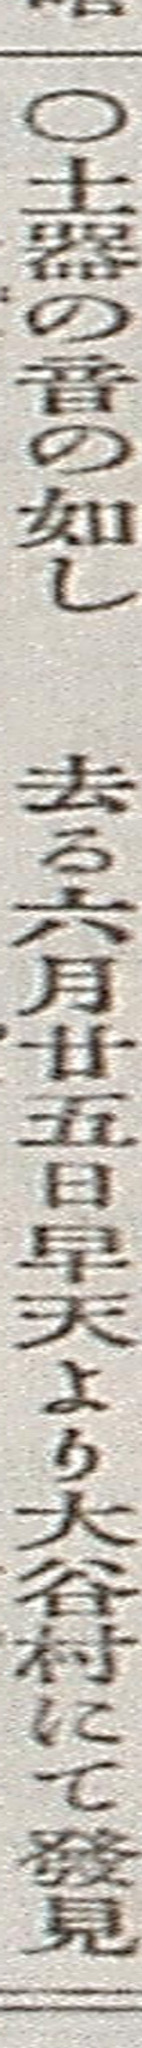○土器の音の如し去る六月廿五日早天より大谷村にて発見
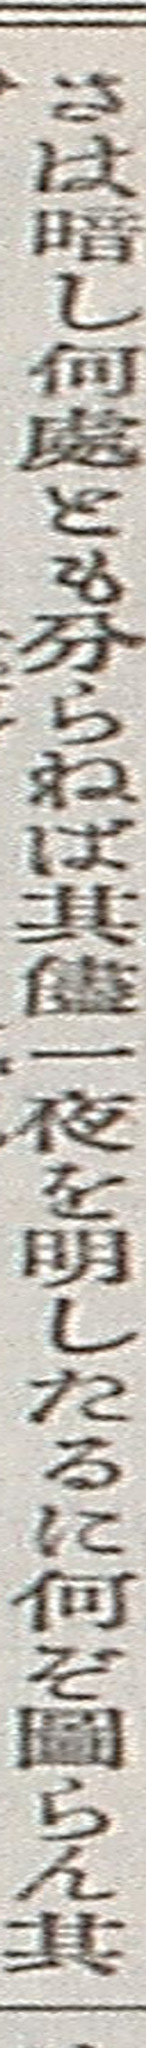さは暗し何処とも分らねば其侭一夜を明したるに何ぞ図らん其
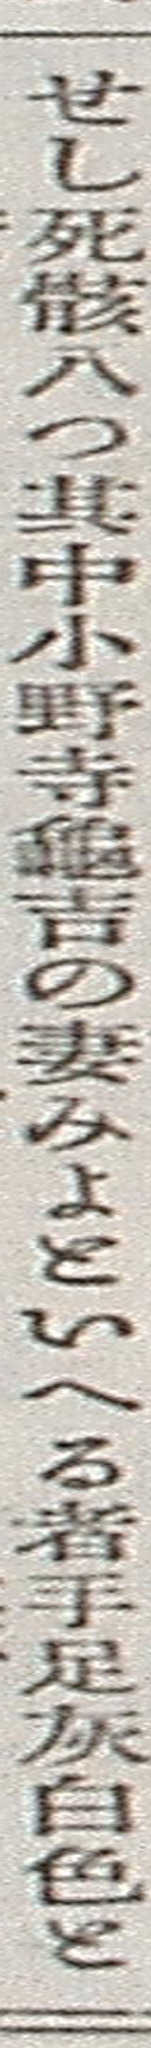せし死骸八つ其中小野寺亀吉の妻みよといへる者手足灰白色と
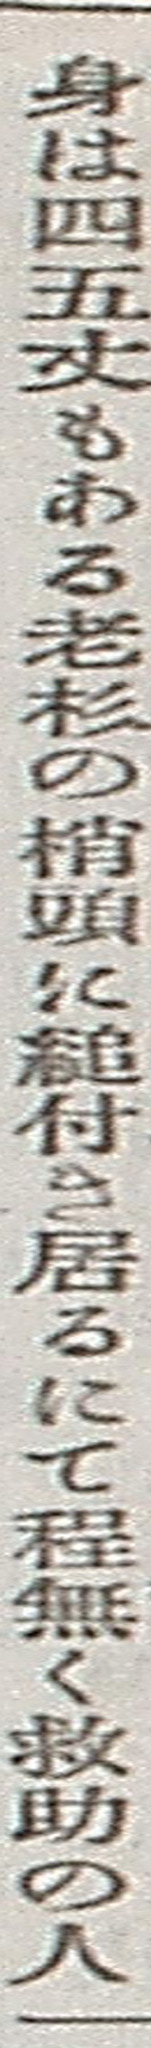身は四五丈もある老杉の梢頭に縋付き居るにて程無く救助の人
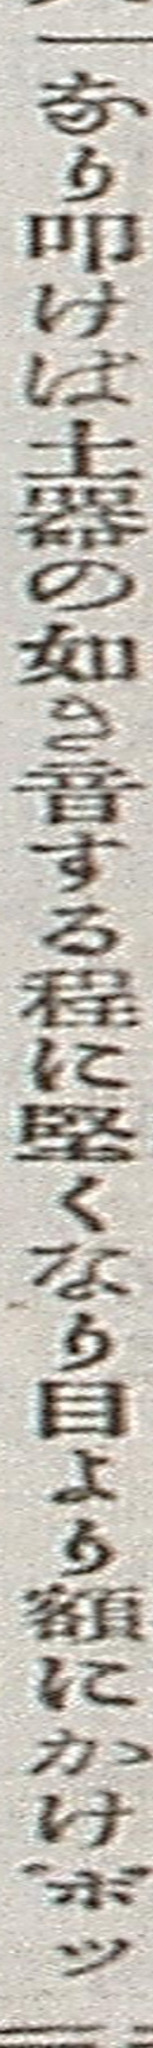なり叩けば土器の如き音する程に堅くなり目より額にかけボツ

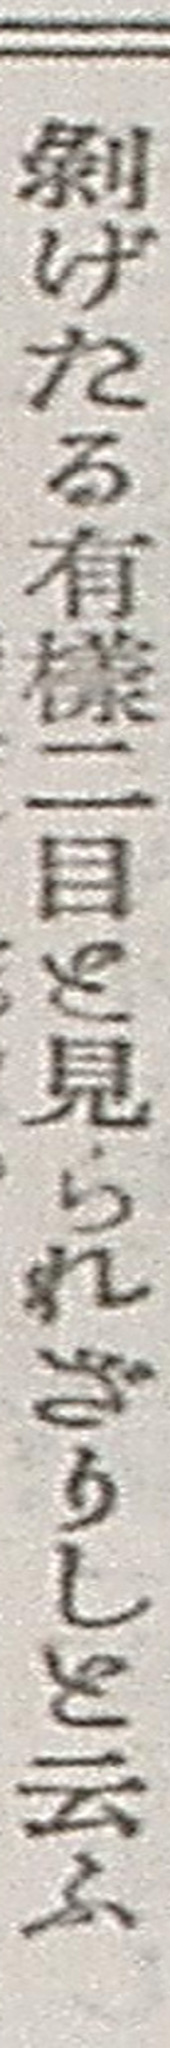剥げたる有様二目と見られざりしと云ふ
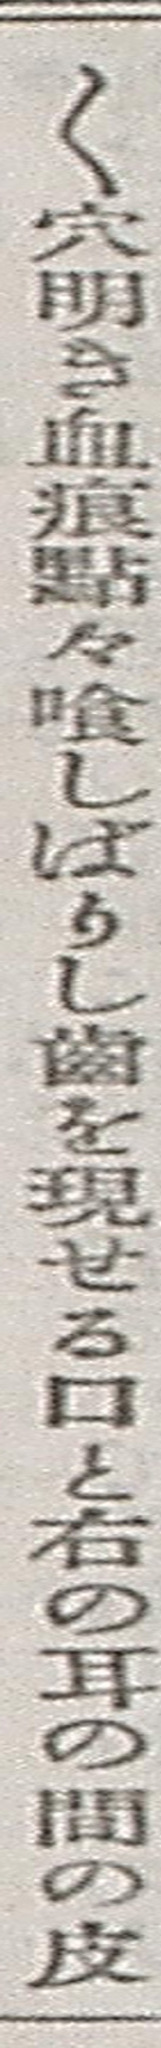〳〵穴明き血痕点々喰しばりし歯を現せる口と右の耳の間の皮
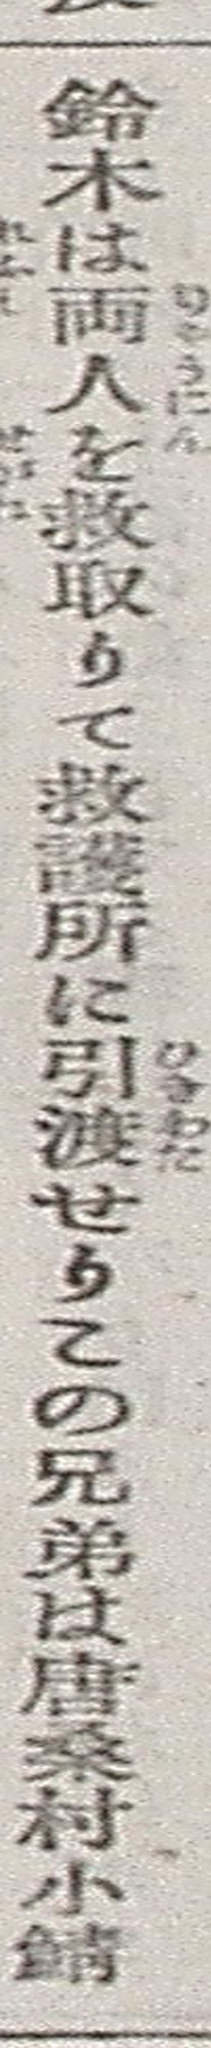鈴木は両人を救取りて救護所に引渡せりこの兄弟は唐桑村小鯖
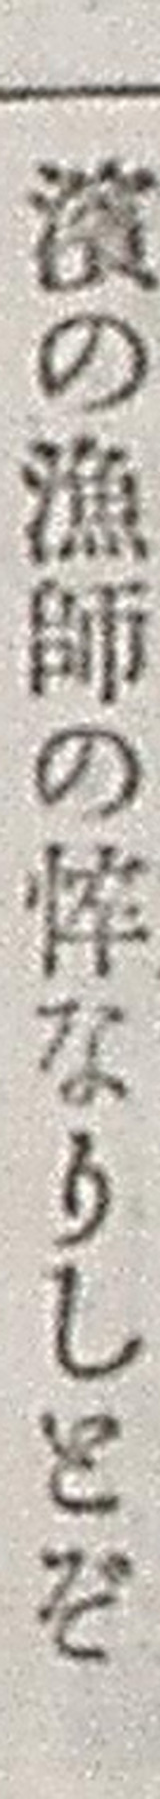浜の漁師の悴なりしとぞ
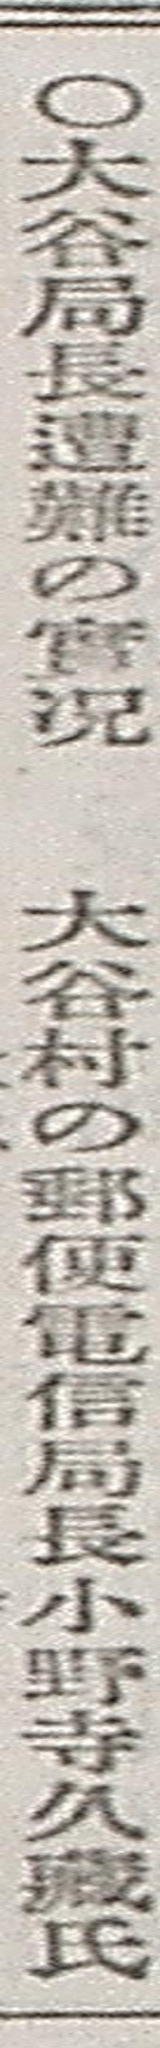○大谷局長遭難の実況大谷村の郵便電信局長小野寺久蔵氏
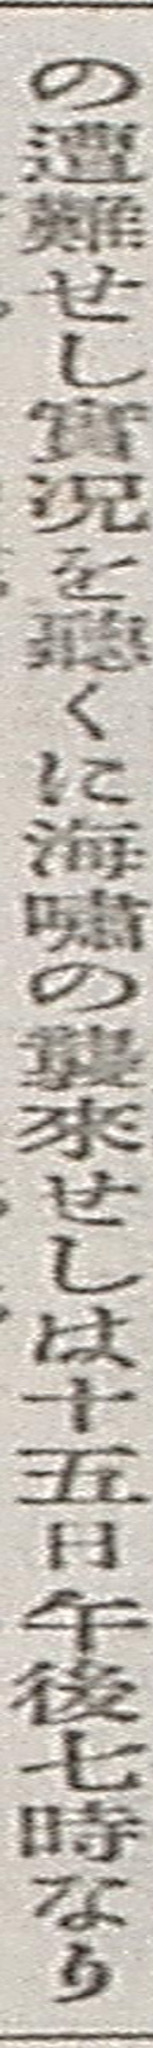の遭難せし実況を聴くに海嘯の襲来せしは十五日午後七時なり
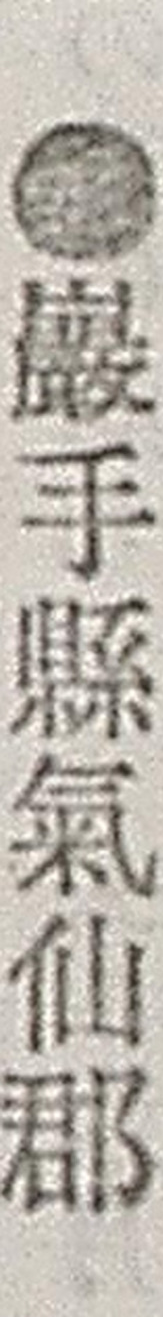●巌手県気仙郡
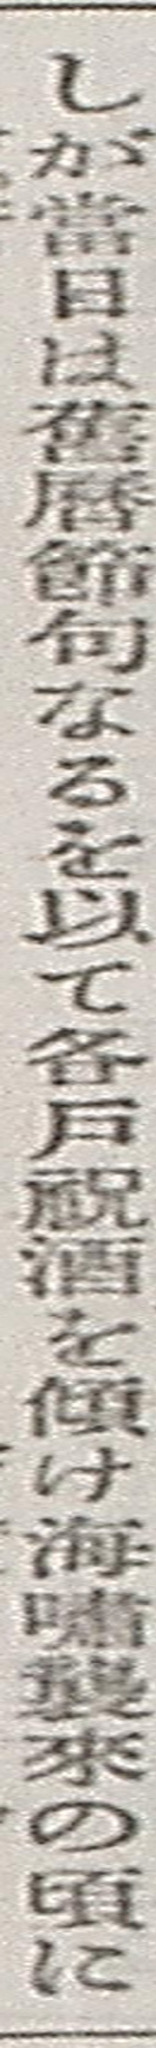しが当日は旧暦節句なるを以て各戸祝酒を傾け海嘯襲来の頃に
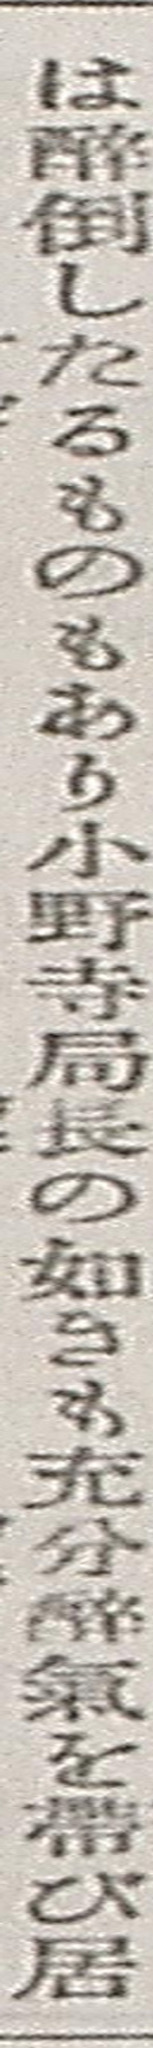は酔倒したるものもあり小野寺局長の如きも充分酔気を帯び居
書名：風俗畫報臨時増刊第百二十號　大海嘯被害録（下）
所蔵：東京大学地震研究所図書室 Earthquake Research Institute Library, The University of Tokyo, JAPAN
